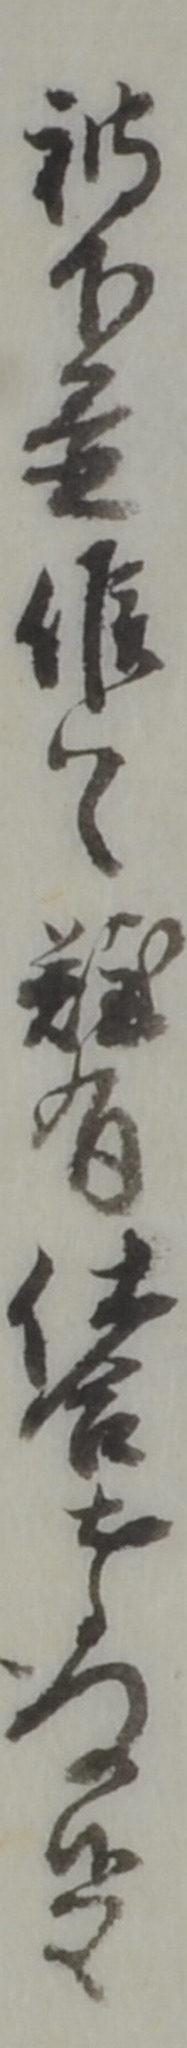被下置候ハヽ難有仕合奉存候以上
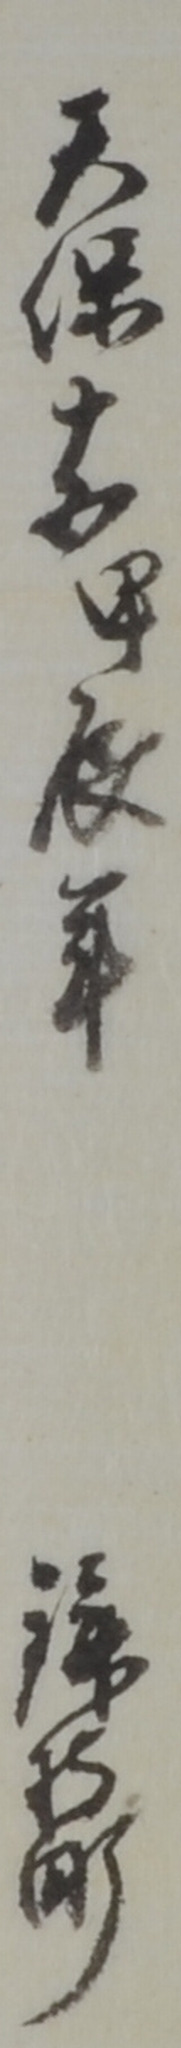天保十五甲辰年鉾持町
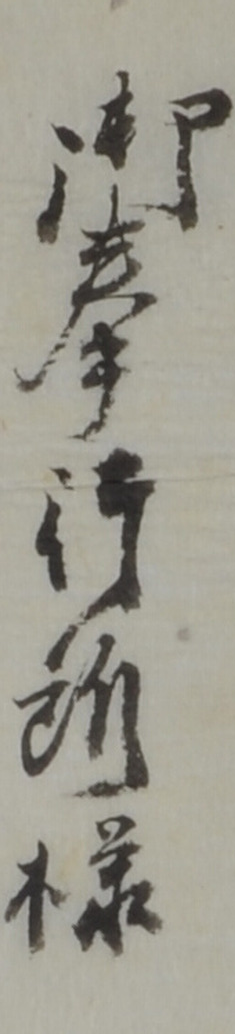御奉行所様

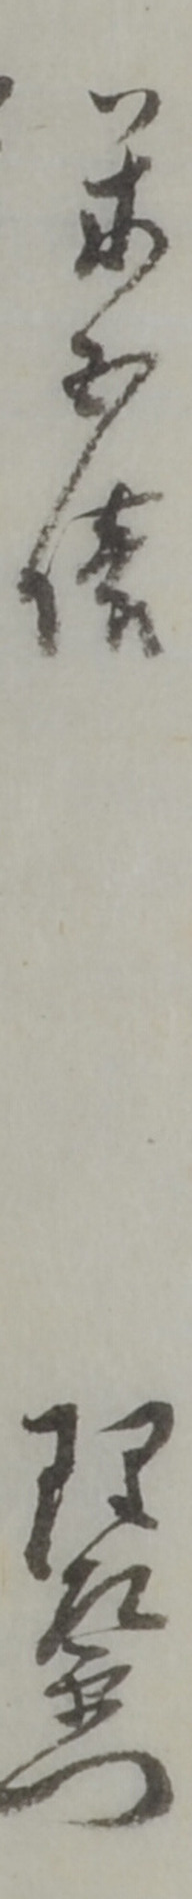米五俵理左衛門
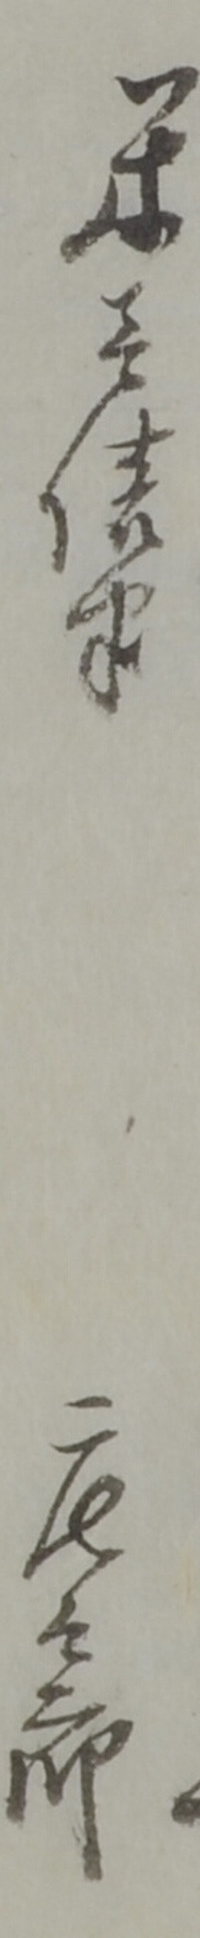米壱表半庄太郎
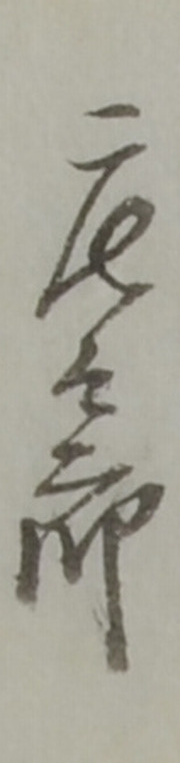庄太郎
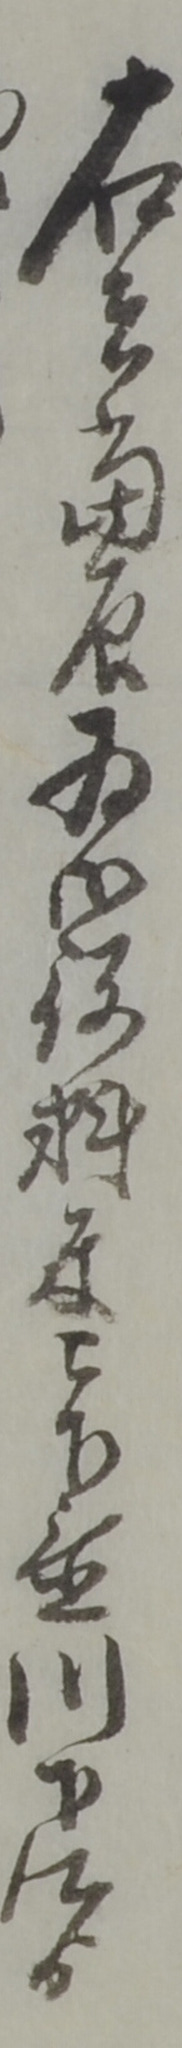右者当辰為御役料米被下置川下郷ゟ
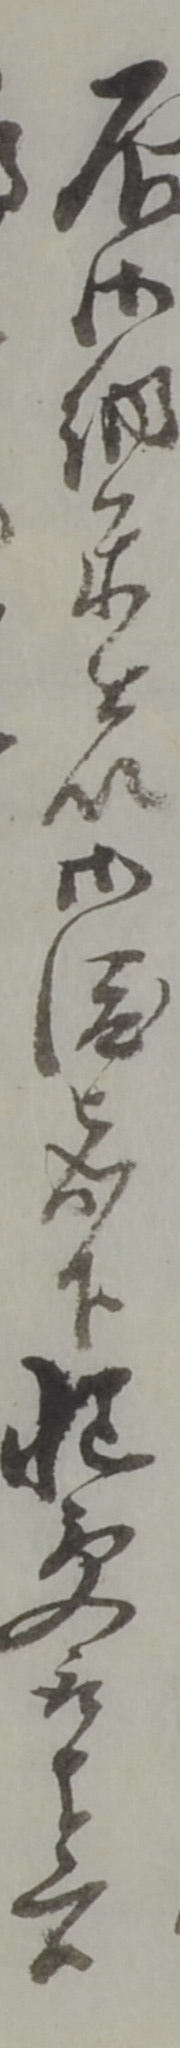辰御納米を以御渡被成下慥受取申上候
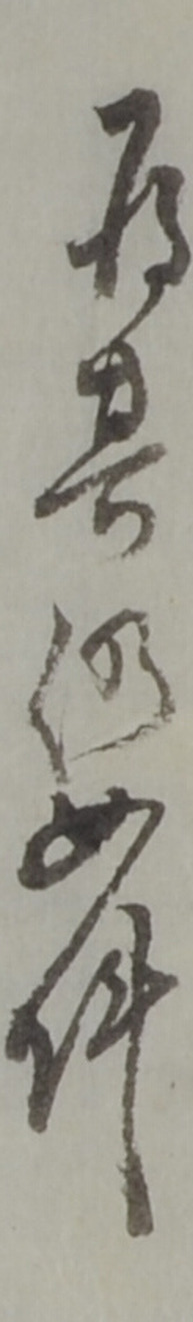為其仍如件
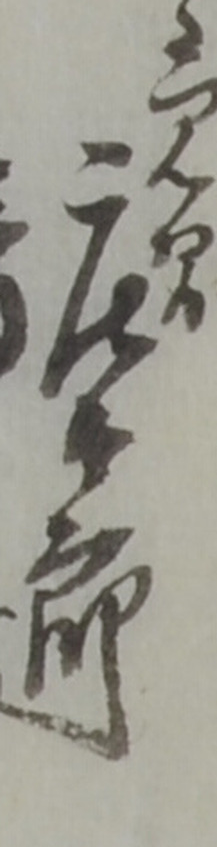庄太郎
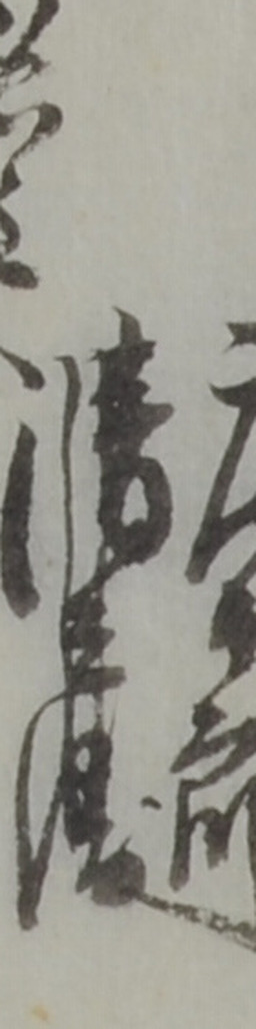清兵衛
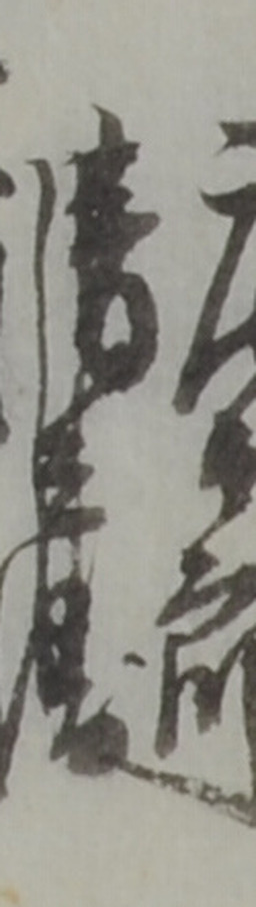清兵衛
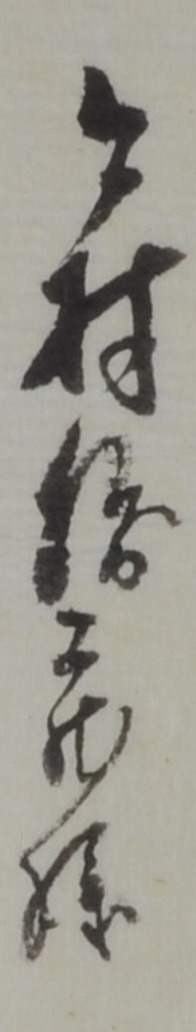今村勝蔵様
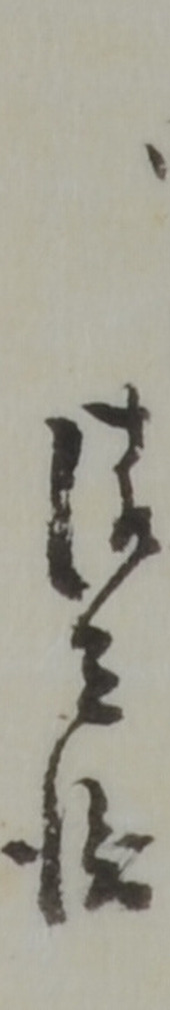清兵衛
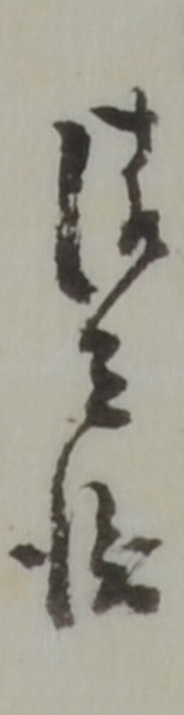清兵衛
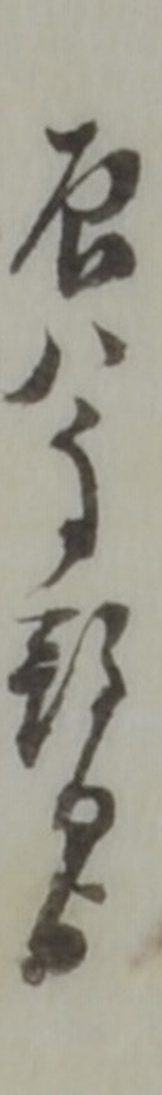辰八年朔日ゟ
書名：諸願書控簿
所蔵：伊那市立高遠町図書館・合同会社AMANE
